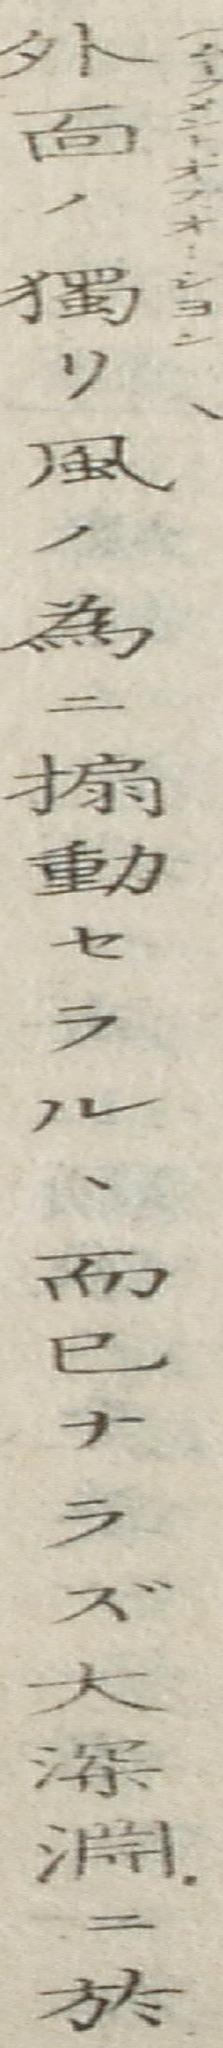外面ノ獨リ風ノ為ニ扇動セラルヽ而已ナラズ大深淵ニ於
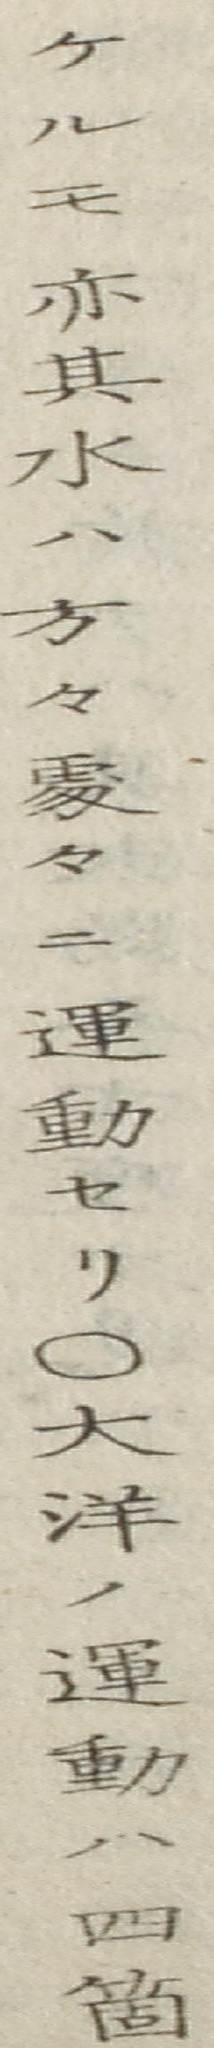ケルモ亦其水ハ方々處々ニ運動セリ○大洋ノ運動ハ四箇
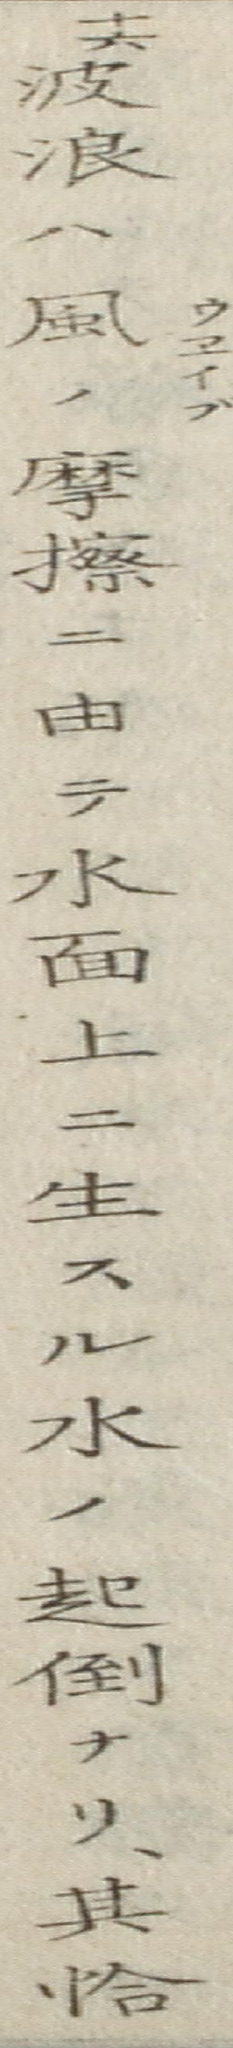十六波浪ハ風ノ摩擦ニ由テ水面上ニ生スル水ノ起倒ナリ、其恰
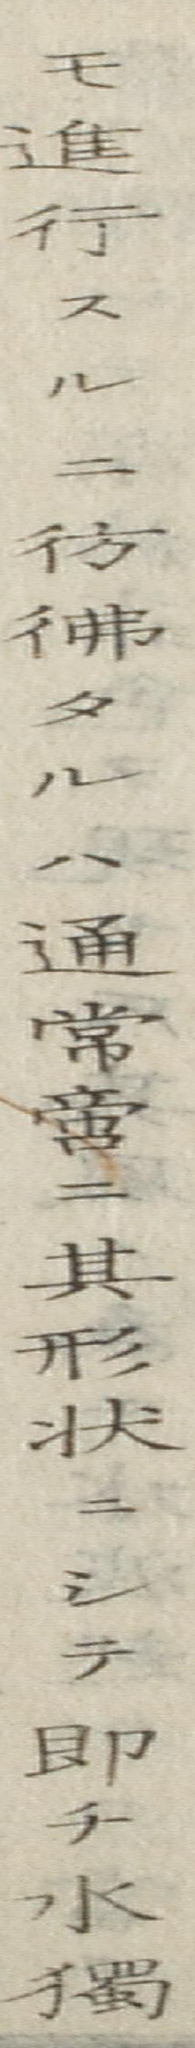モ進行スルニ彷彿タルハ通常啻ニ其形状ニシテ即チ水獨
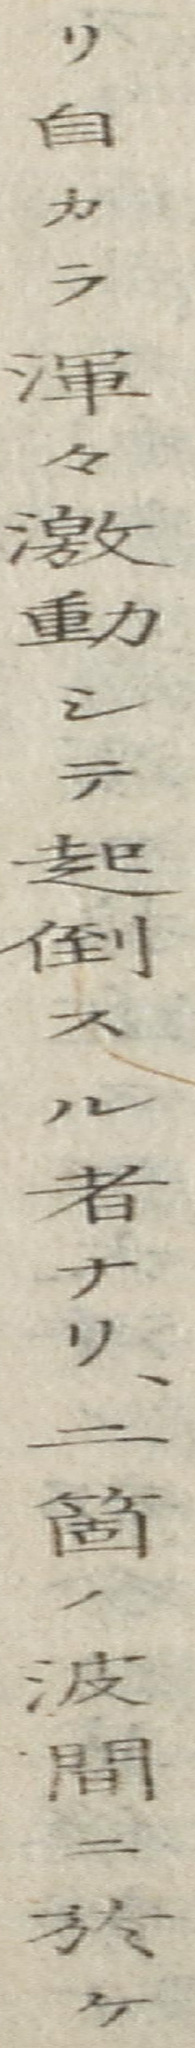リ自カラ渾々激動シテ起倒スル者ナリ、ニ箇ノ波間ニ於ケ
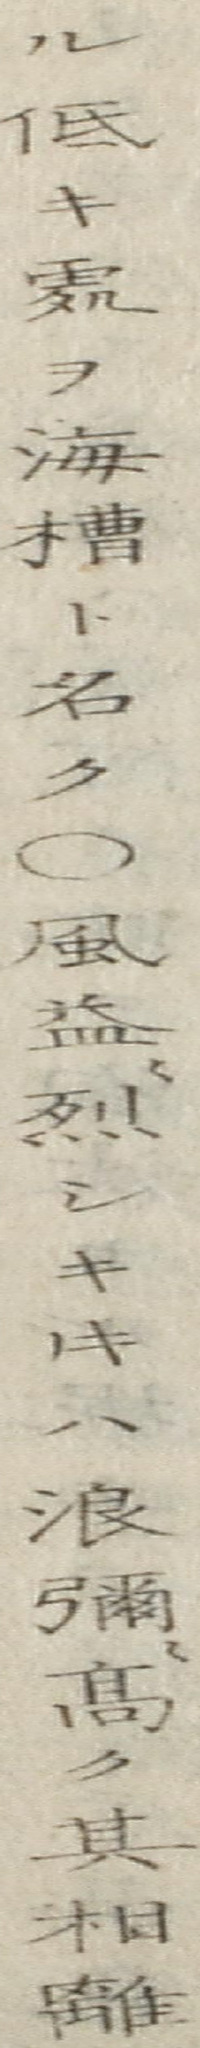ル低キ處ヲ海槽ト名ク○風益々烈シキトキハ浪彌々高ク其相離
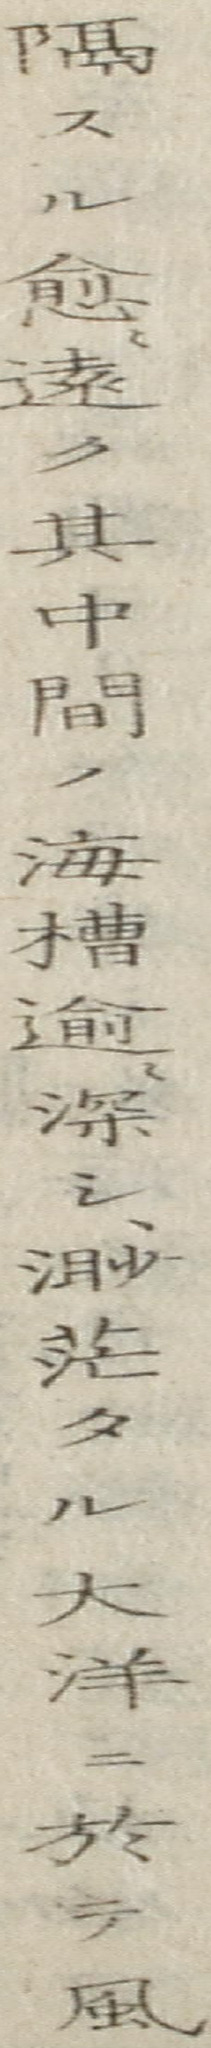隔スル愈々遠ク其中間ノ海槽逾々深シ、渺茫タル大洋ニ於テ風
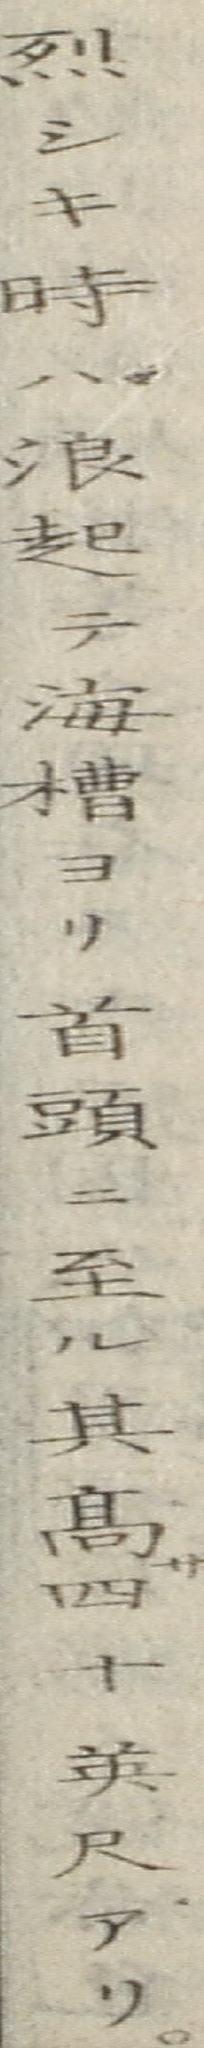烈シキ時ハ浪起テ海槽ヨリ首頭ニ至ル其高サ四十英尺アリ。
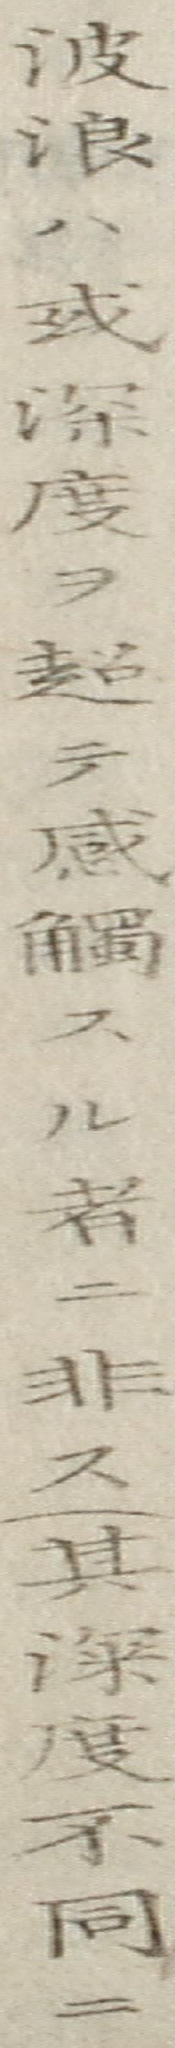波浪ハ或深度ヲ超テ感触スル者ニ非ス（其深度不同ニ
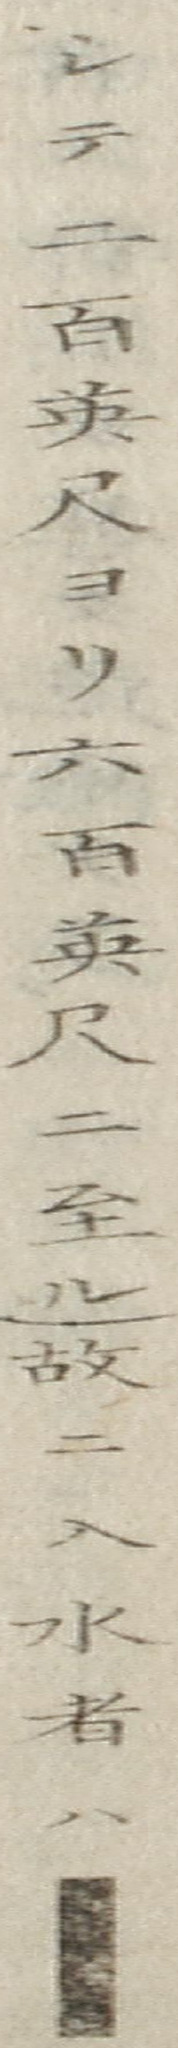シテ二百英尺ヨリ六百英尺ニ至ル）故ニ入水者ハ
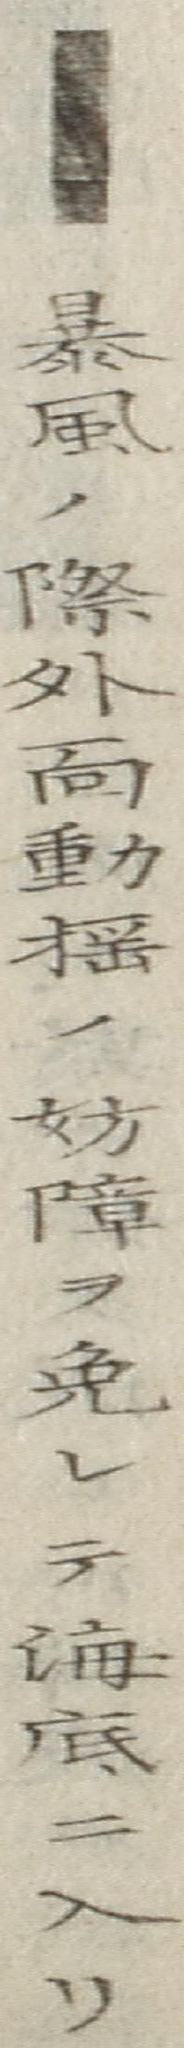暴風の際外面動揺ノ妨障ヲ免レテ海底ニ入リ
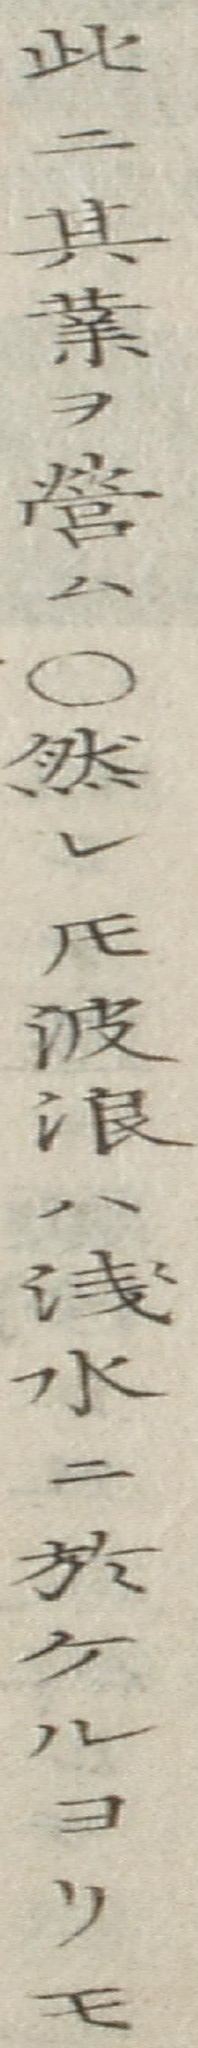此ニ其業ヲ営ム○然レトモ波浪ハ浅水ニ於ケルヨリモ
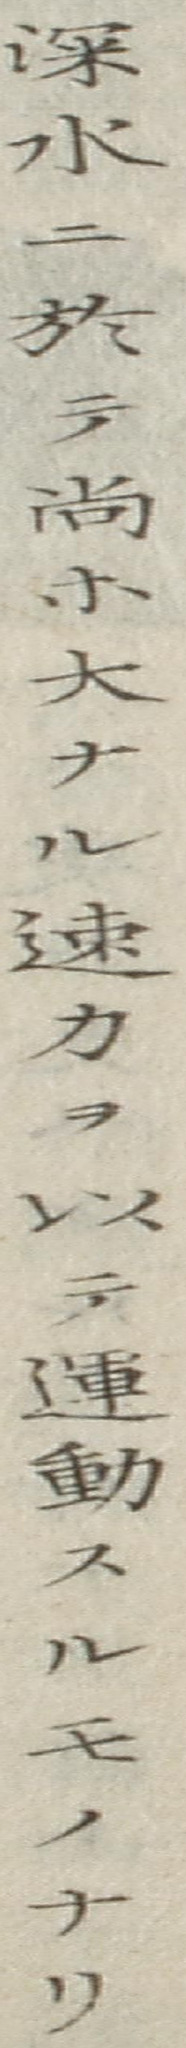深水ニ於テ尚ホ大ナル速力ヲ以テ運動スルモノナリ
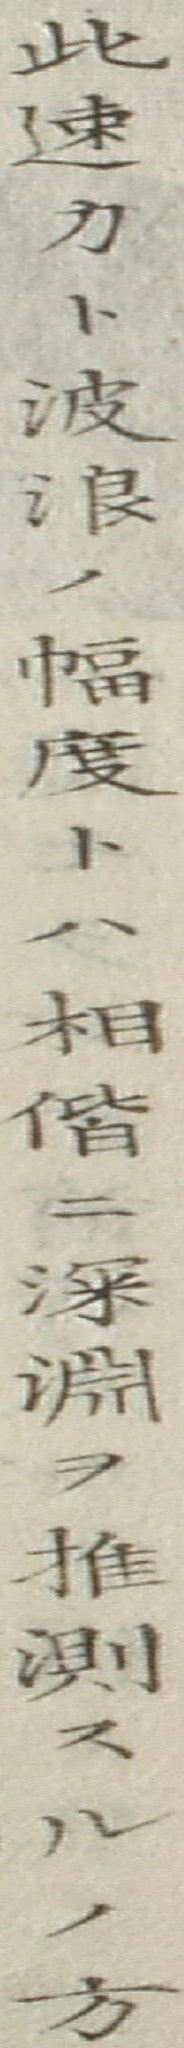此速力ト波浪ノ幅度トハ相偕ニ深淵ヲ推測スルノ方
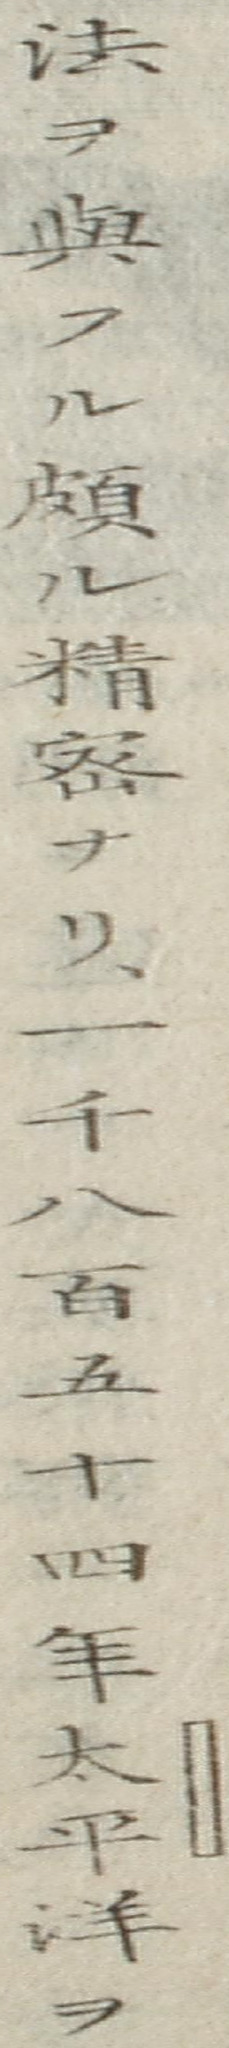法ヲ與フル頗ル精密ナリ、一千八百五十四年太平洋ヲ
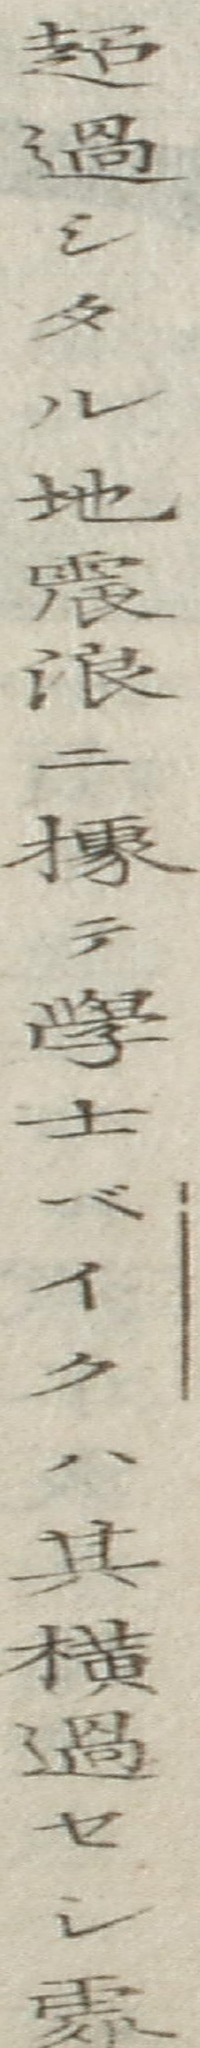超過シタル地震浪ニ據テ学士ベイクハ其横過セシ處
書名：地形論　巻二
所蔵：東京大学地震研究所図書室 Earthquake Research Institute Library, The University of Tokyo, JAPAN
